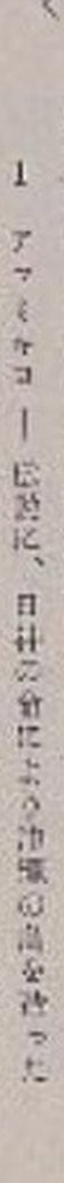１アマミキヨ―伝説に、日神の命により沖縄の島を造った
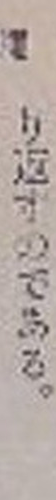り返すのである。
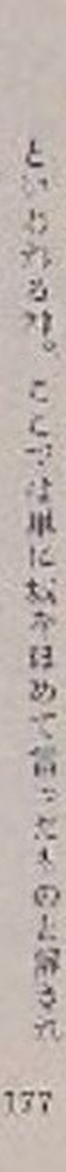といわれる神。ここでは単に城をほめて言ったものと解され
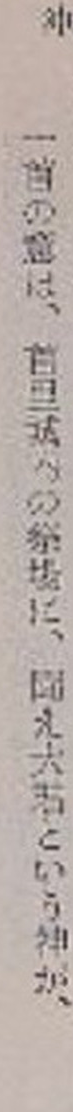一首の意は、首里城内の祭場に、聞え大君という神が、

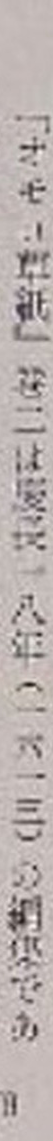『オモロ草紙』巻二は慶長一八年(一六一三)の編集であ
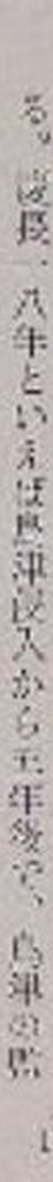る。慶長一八年といえば島津侵入から五年後で、島津の監
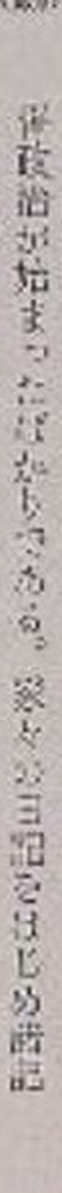督政治が始まったばかりである。家々の日記をはじめ諸記
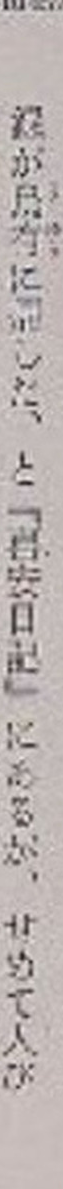録が烏有に帰した、と『喜安日記』にあるが、せめて人び
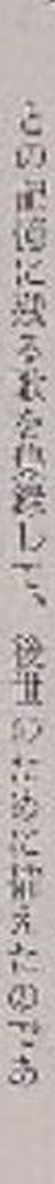との記憶に残る歌を集録して、後世のために備えたのであ
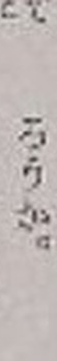ろうか。
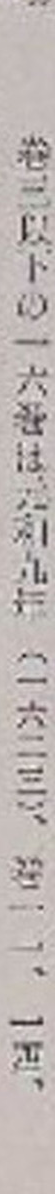巻三以下の一六巻は元和九年(一六二三)、巻一一、一四、
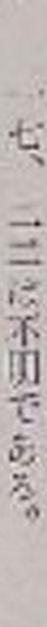一七、二二は不明である。
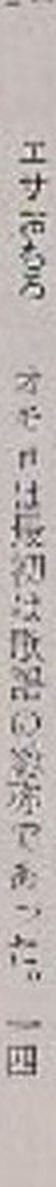エサおもろオモロは最初は歌謡の称であった。一四
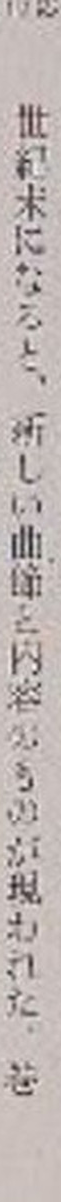世紀末になると、新しい曲節と内容のものが現われた。巻
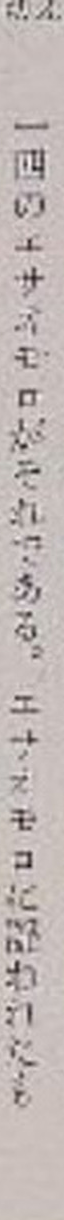一四のエサオモロがそれである。エサオモロに謡われたも
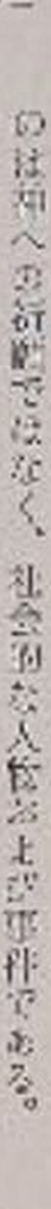のは神への祈願ではなく、社会的な人物および事件である。
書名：沖縄口承文芸
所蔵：University of the Ryukyus Library
